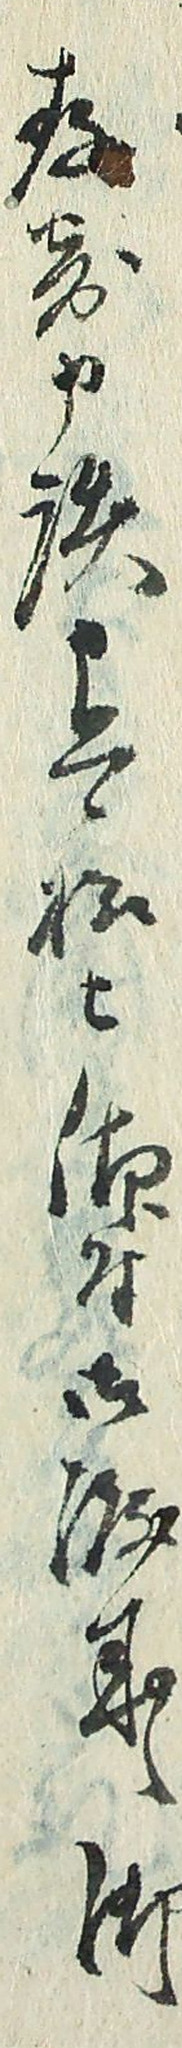存寄申談申上候様被仰付御渡成候御
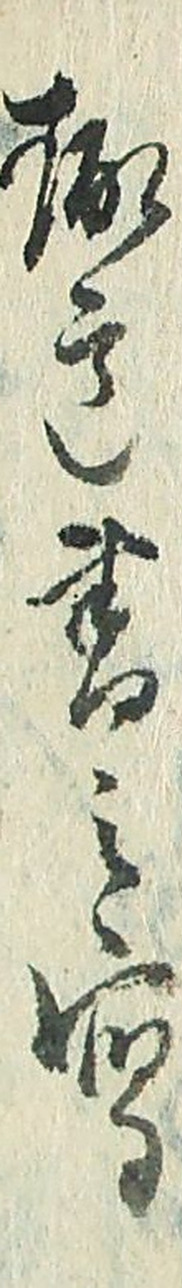趣意書之寫

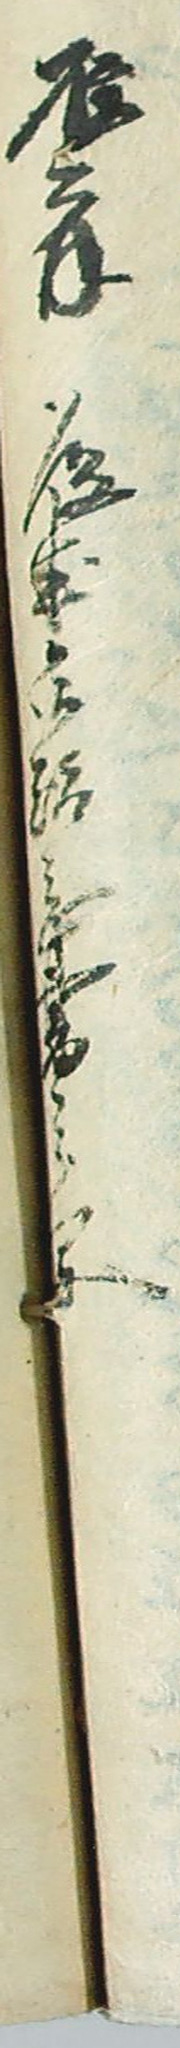辰二月御渡成候御趣意書之写

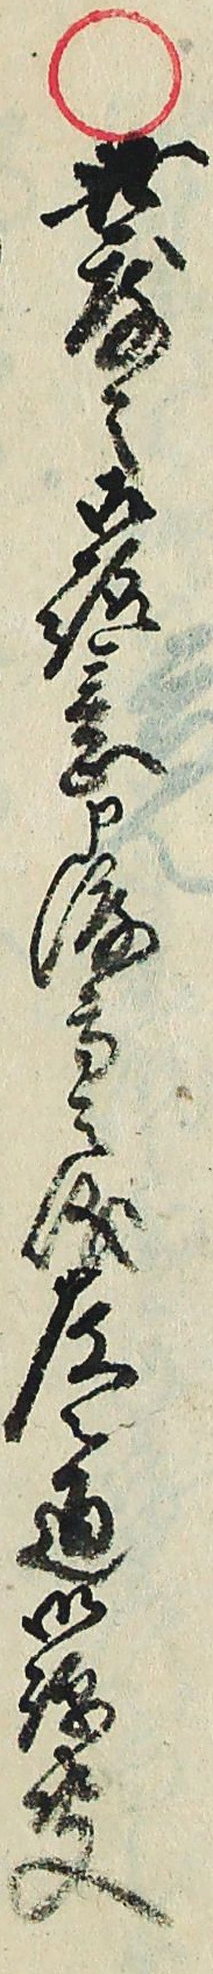○此度之御趣意申渡方之儀左之通御評決
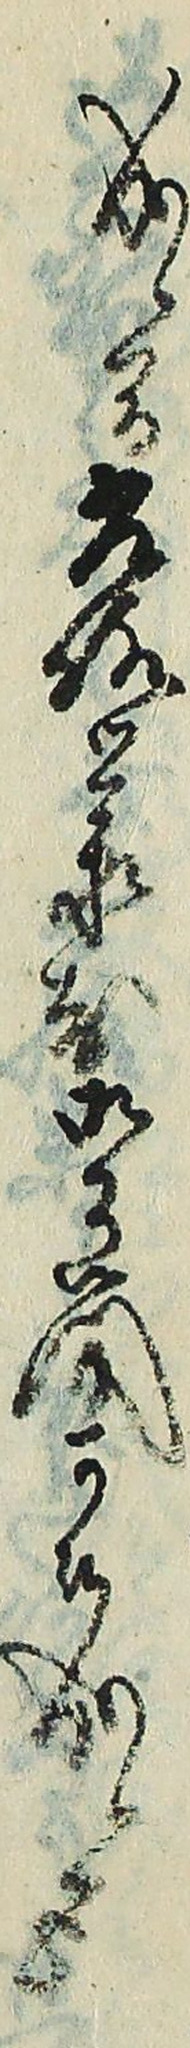被成候間左様御承知御了簡可被成候以上
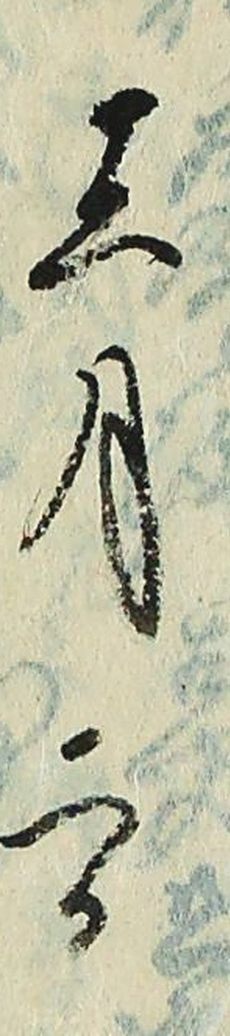十二月二日
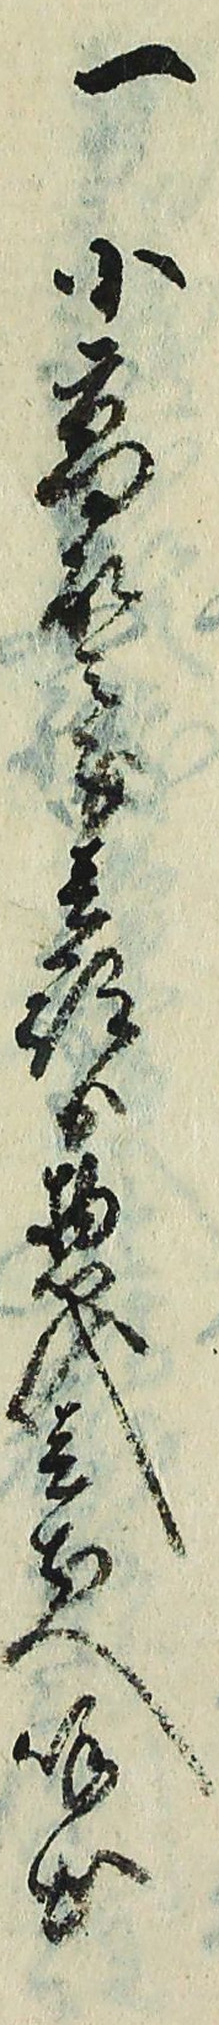一小高取之義壱郡ゟ惣代壱両人呼出
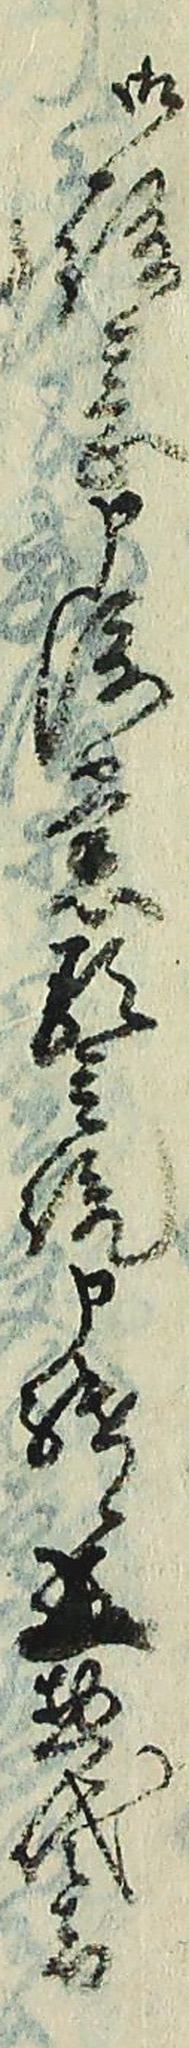御趣意申渡黨類壱統申継候上惣代之者
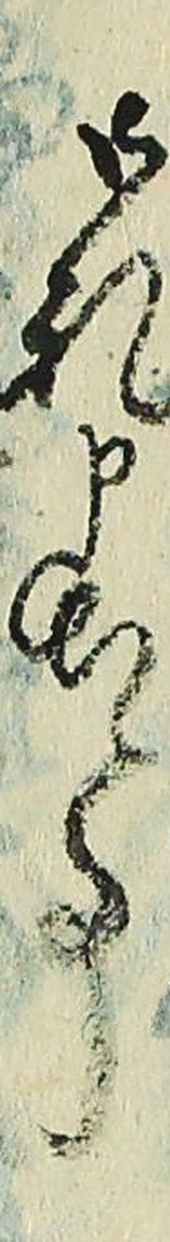御礼申出候事
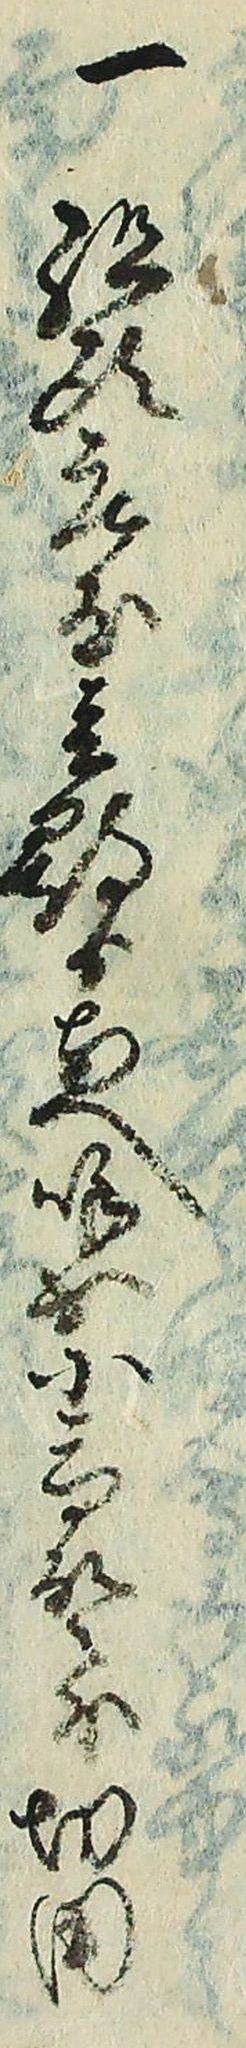一組頭庄屋壱郡ゟ両人呼出小高取之外切田
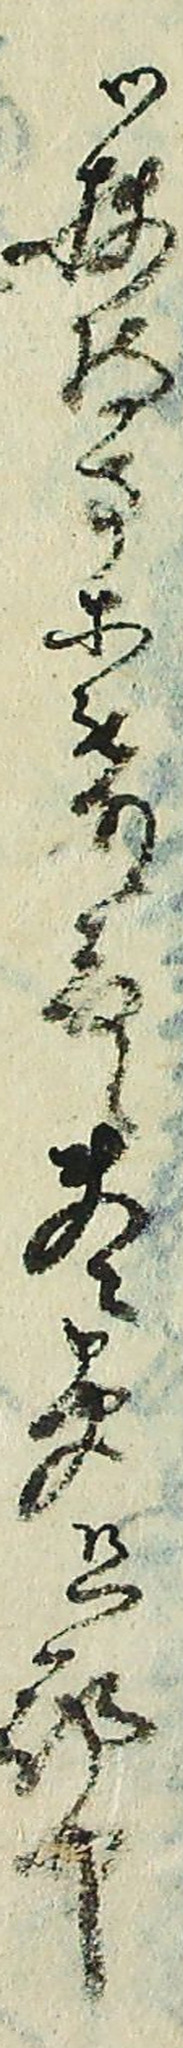御扶持方等被下候者へ夫々申聞且郡中
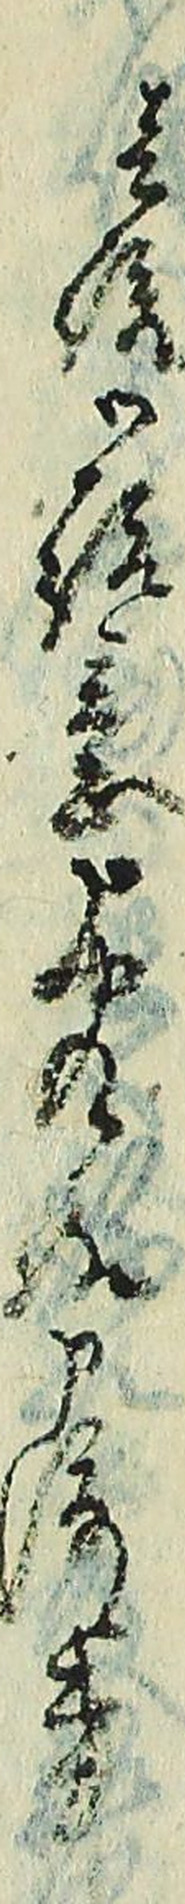壱統御趣意申聞候様申渡候事
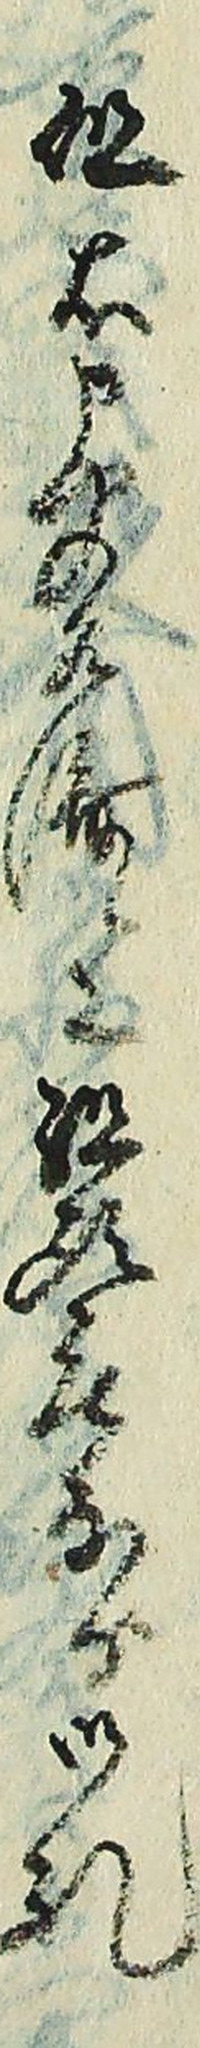但右申聞相濟候上組頭庄屋ゟ御礼
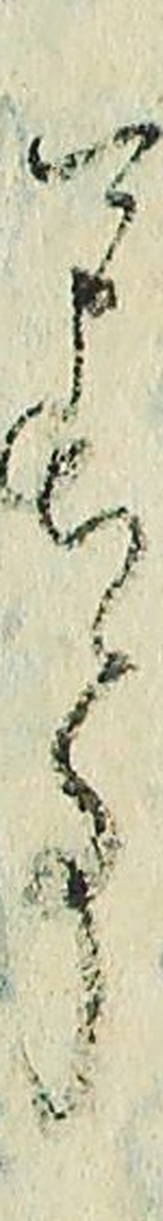可申出候事
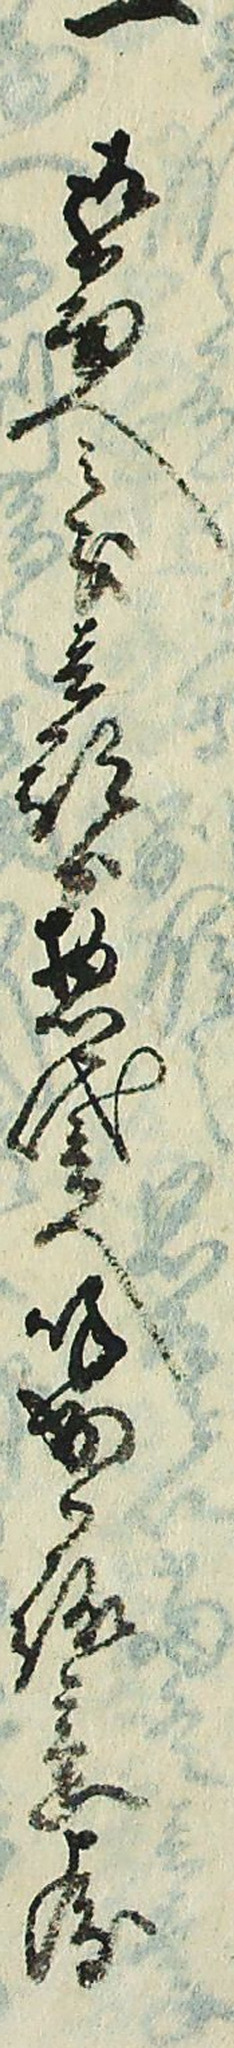一御番人之義壱郡ゟ惣代壱人呼出御趣意申渡
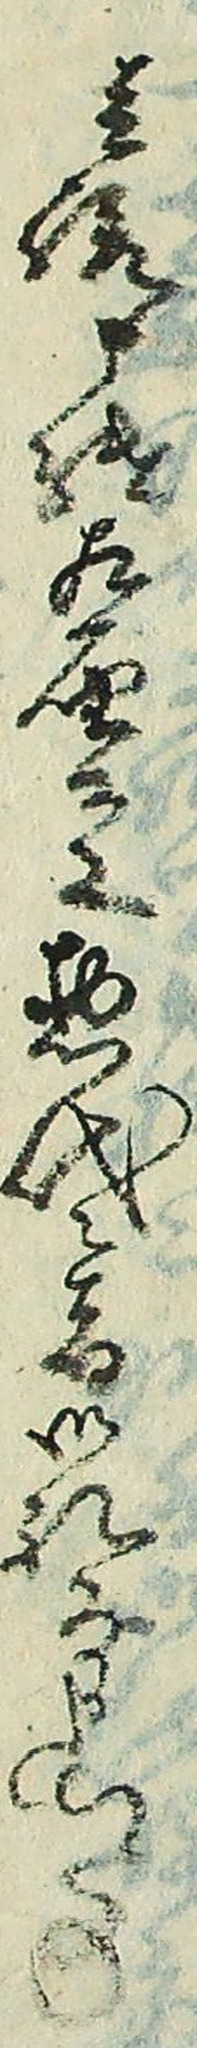壱統申継相届候上惣代之者御礼可申出候事
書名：諸御趣意書并御下知向之写
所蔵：鳴門教育大学 Naruto University of Education
